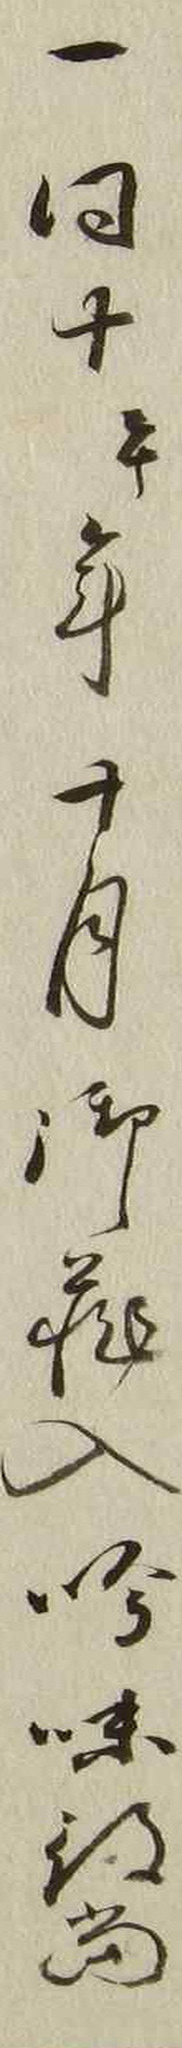一同十午年十月御蔵入吟味役当
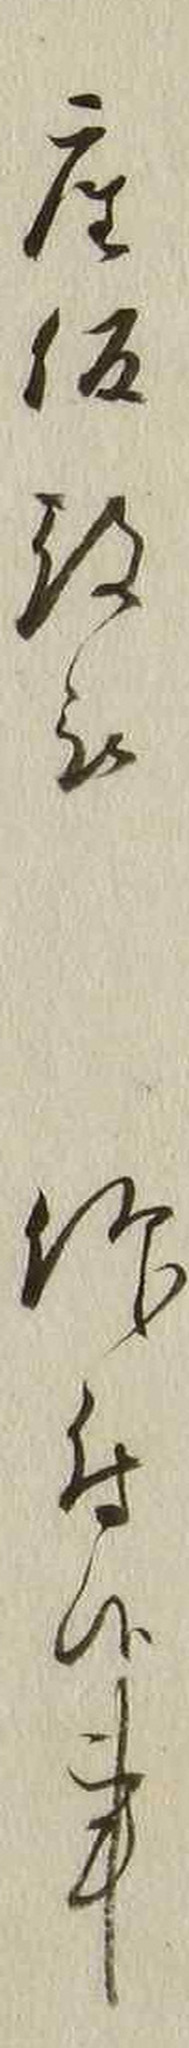座仮役被仰付候事
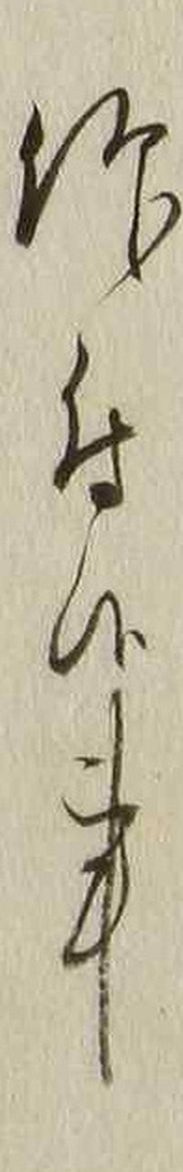仰付候事
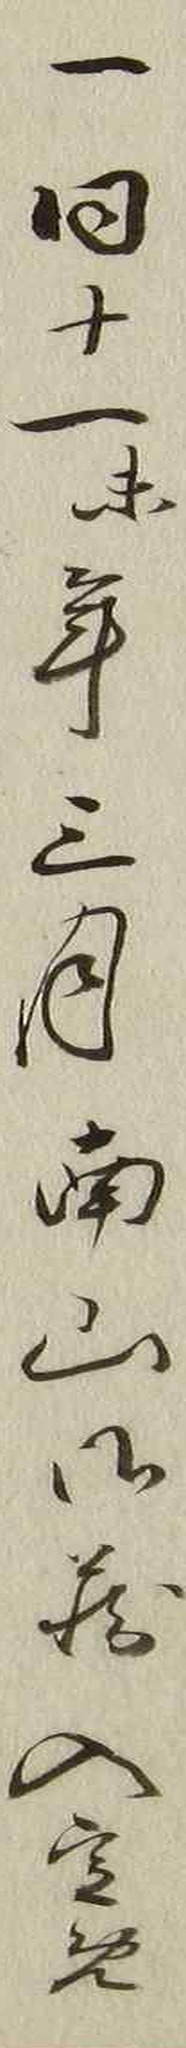一同十一未年三月南山御蔵入定免
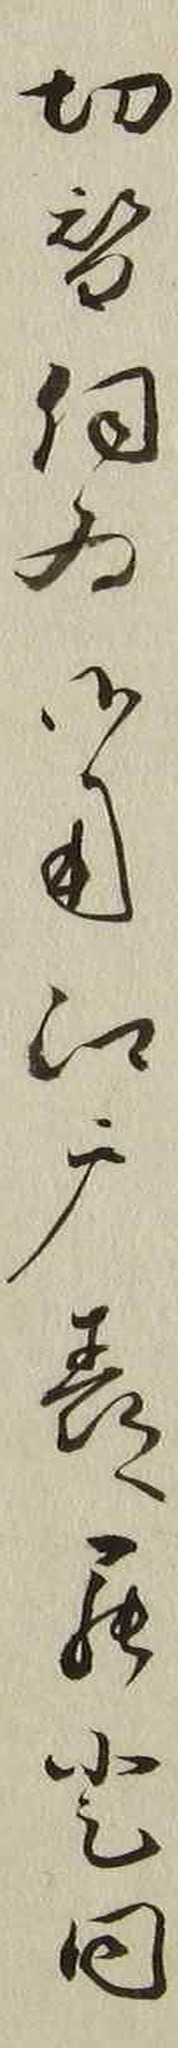切替伺為御用江戸表へ罷登同
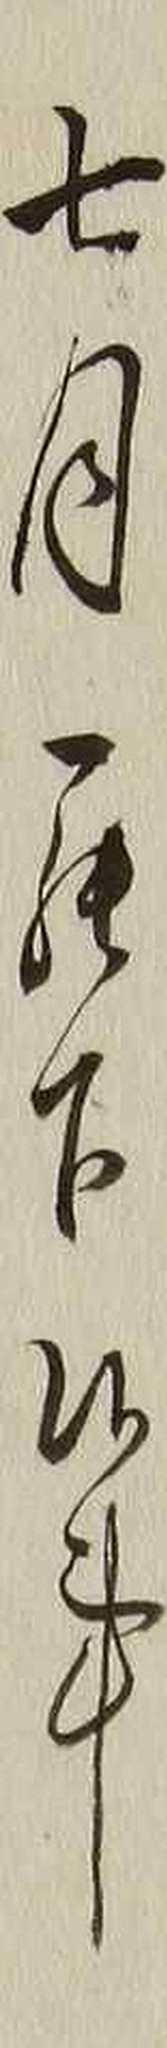七月罷下候事
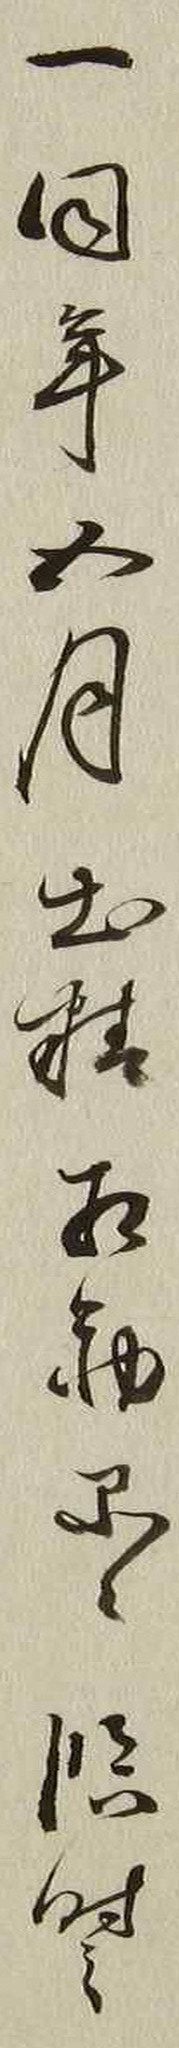一同年五月出精相勤品々臨時之
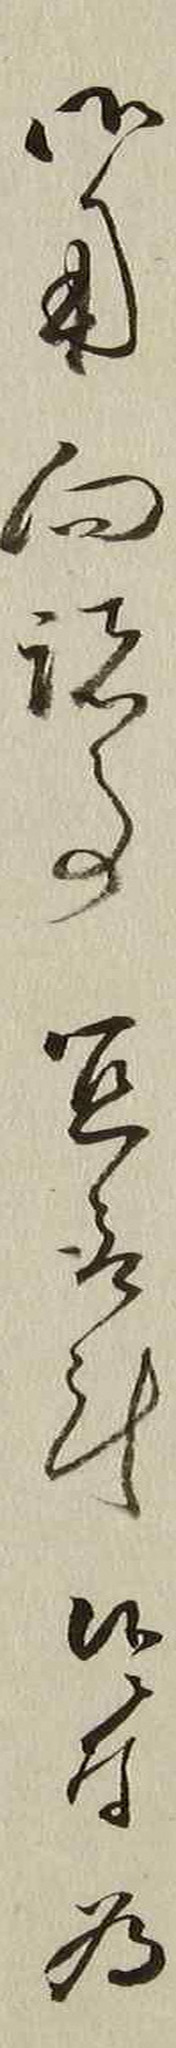御用向諸事宜取計候ニ付為
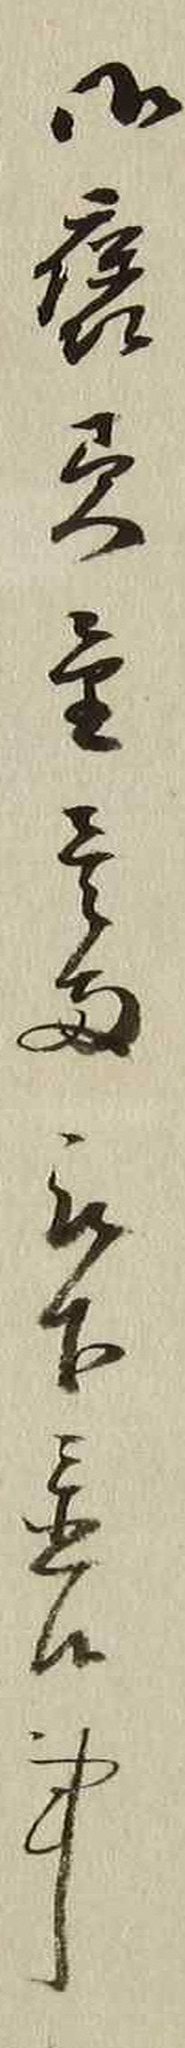御褒美金壱両被下置候事
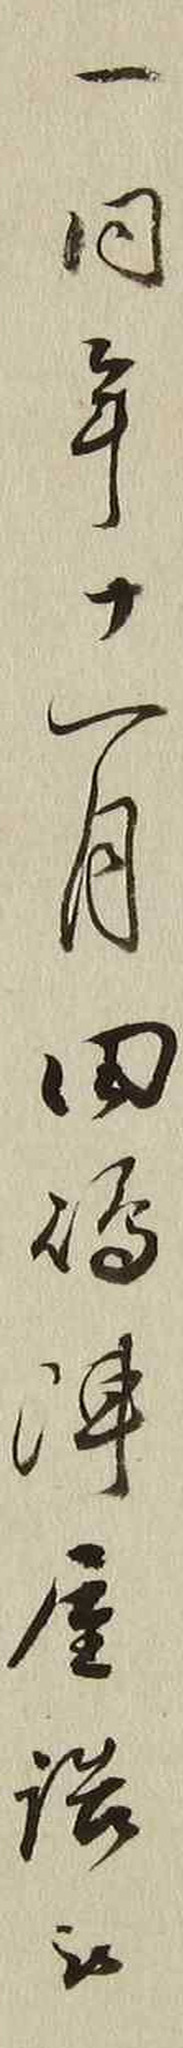一同年十一月田嶋陣屋詰被
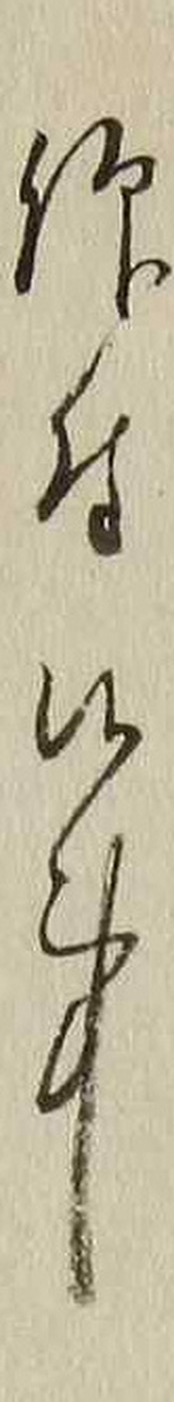仰付候事
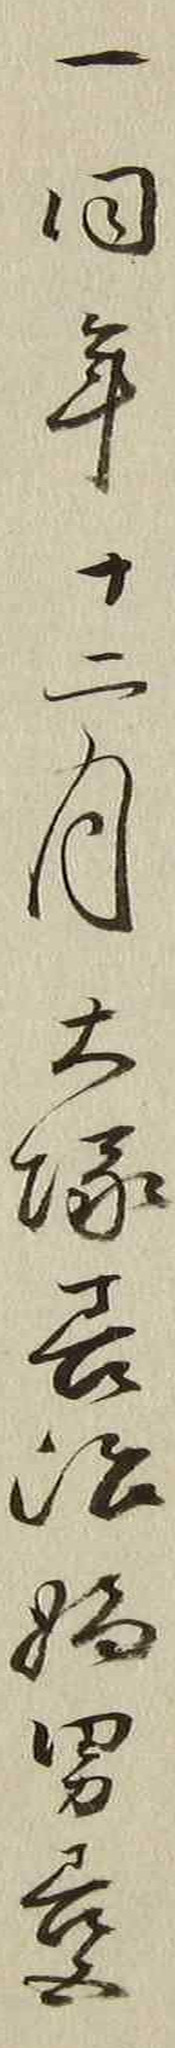一同年十二月大塚善治嫡男善五
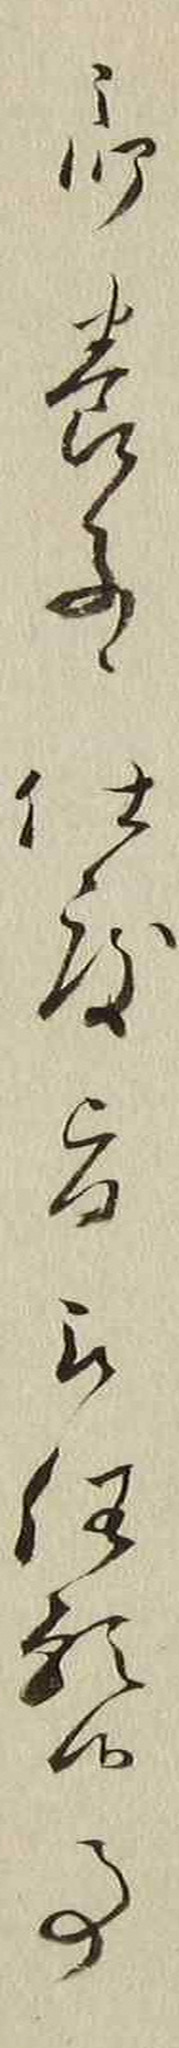郎養子ニ仕度旨被任願候事
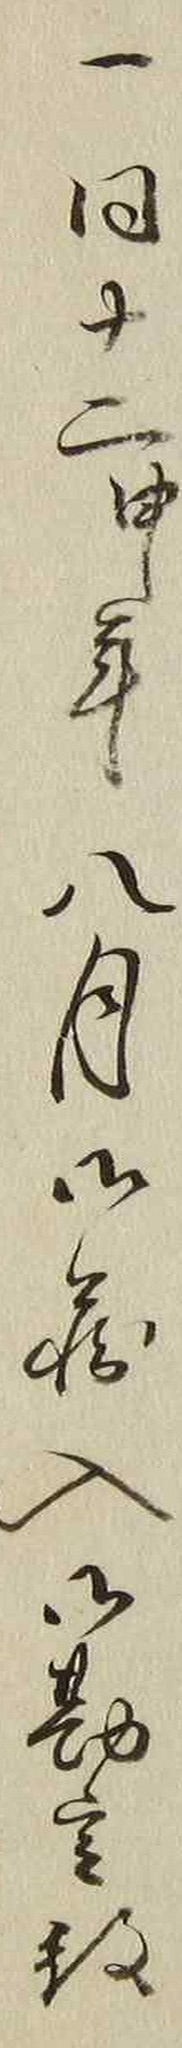一同十二申年八月御蔵入御勘定役
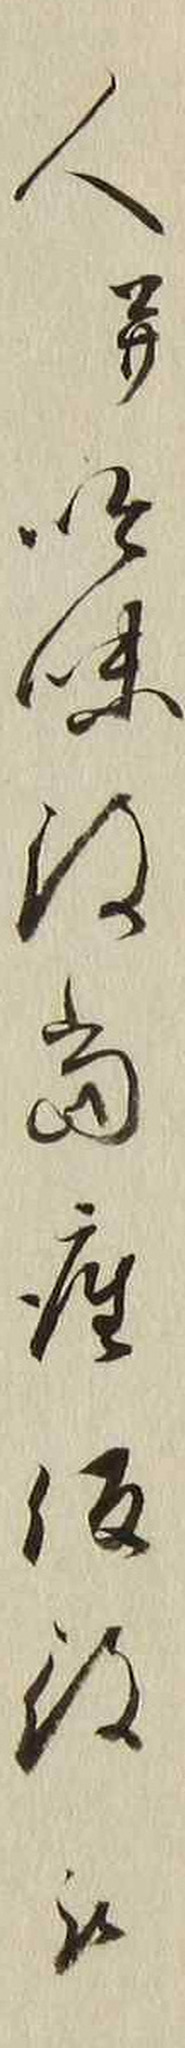人幷吟味役当座仮役被
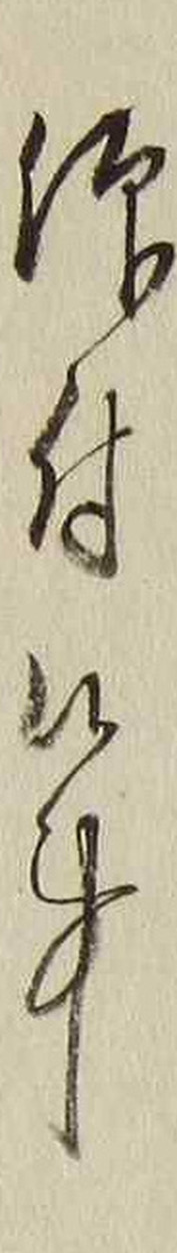仰付候事
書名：諸士系譜　巻之52　に之部3
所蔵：会津若松市立会津図書館
